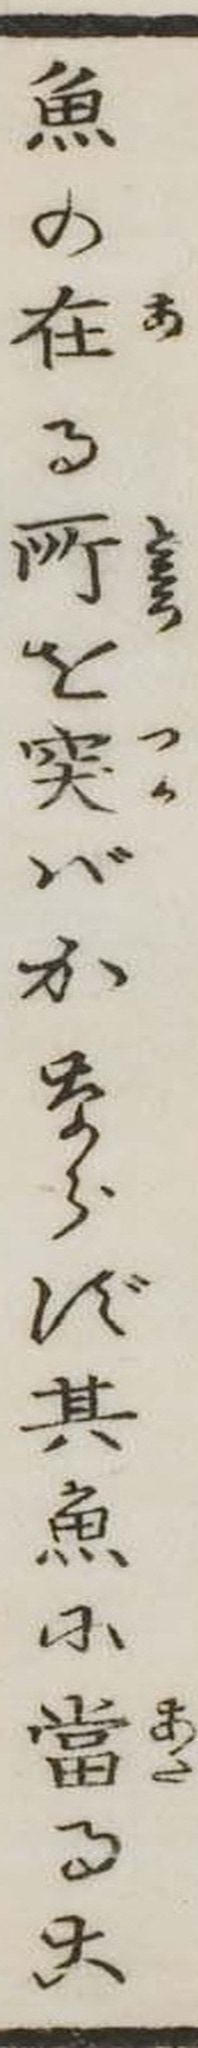魚の在る所を突ばかならず其魚に當るこ
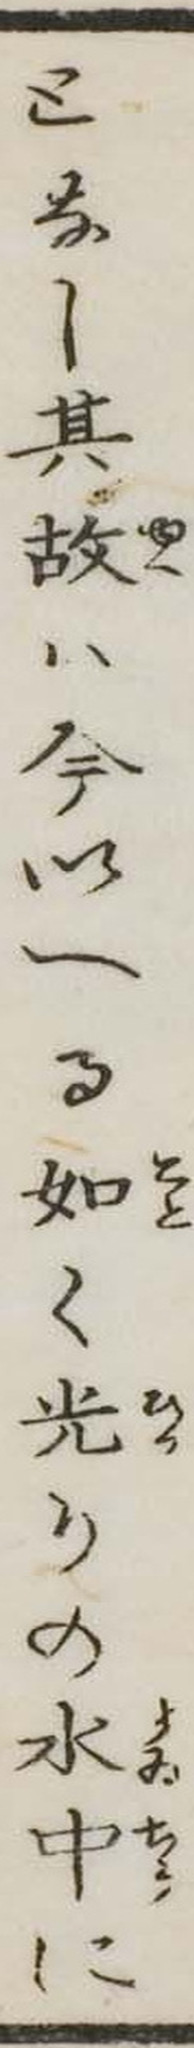となし其故は今いへる如く光りの水中に
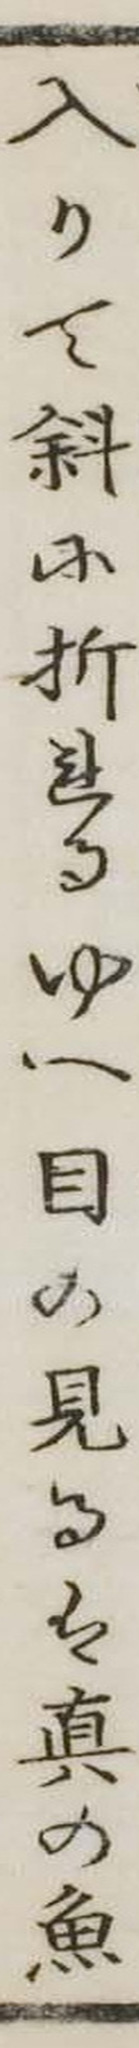入りて斜に折れるゆへ目の見るは真の魚
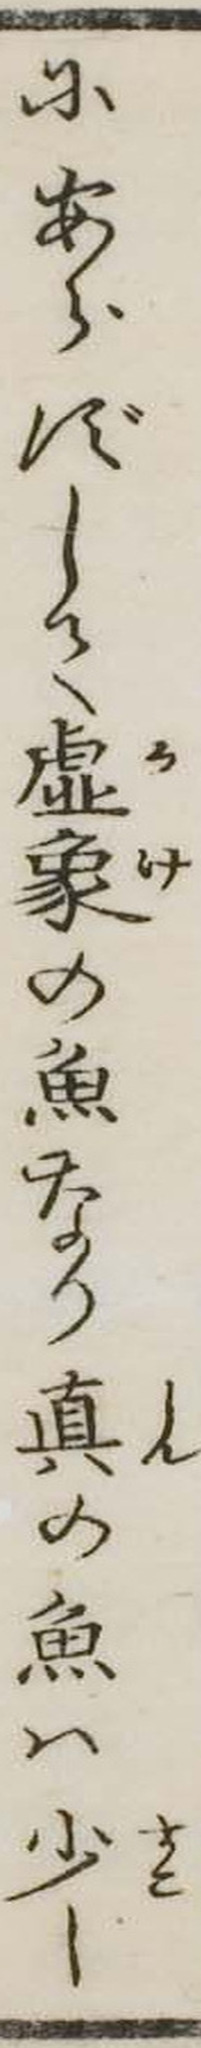にあらずして虚象の魚なり真の魚は少し
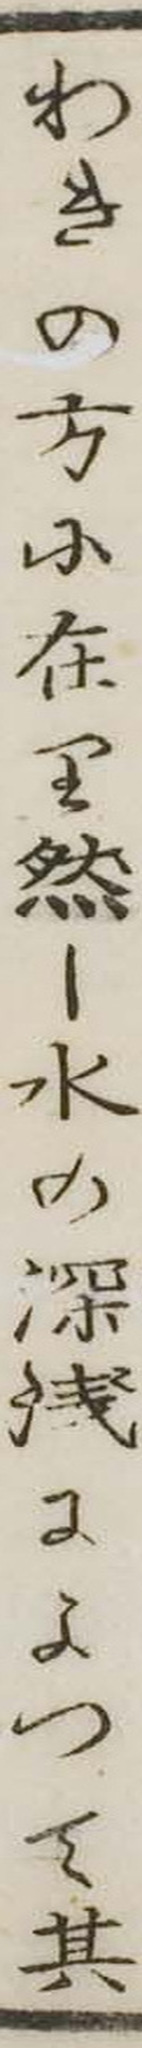わきの方に在り然し水の深浅によつて其
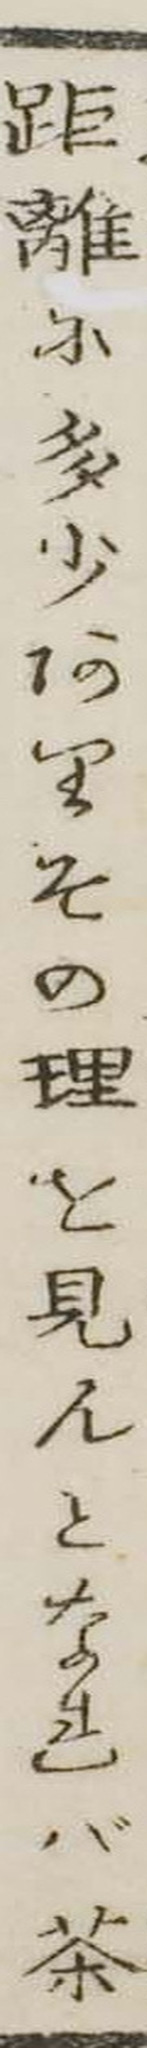距離に多少ありその理を見んとなれば茶
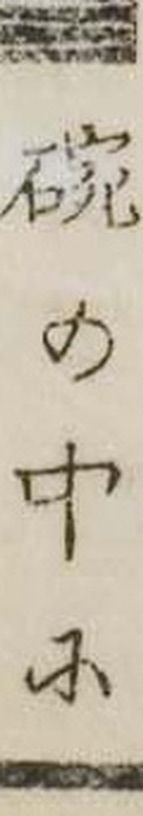碗の中に
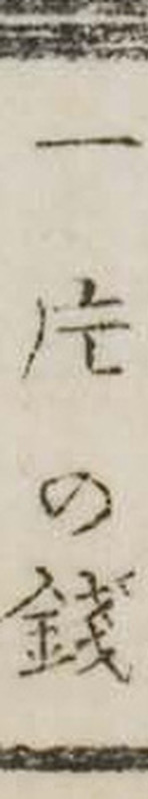一片の銭
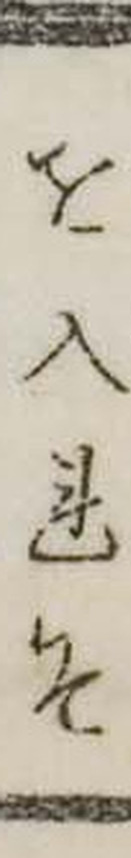を入れそ
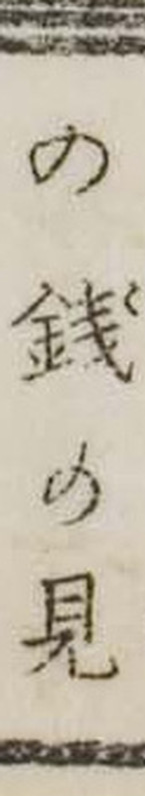の銭の見
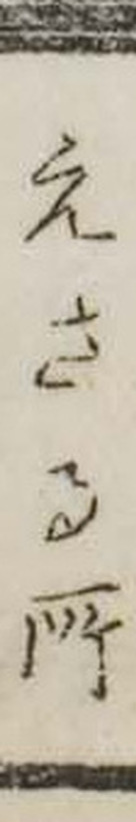えさる所
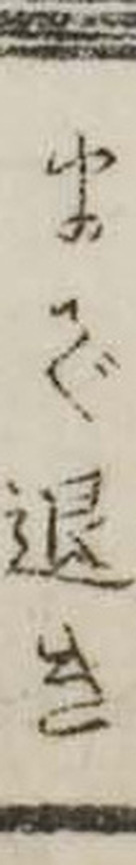まで退き
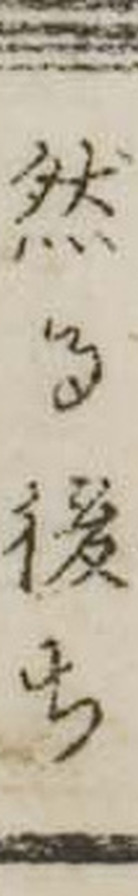然る後ち

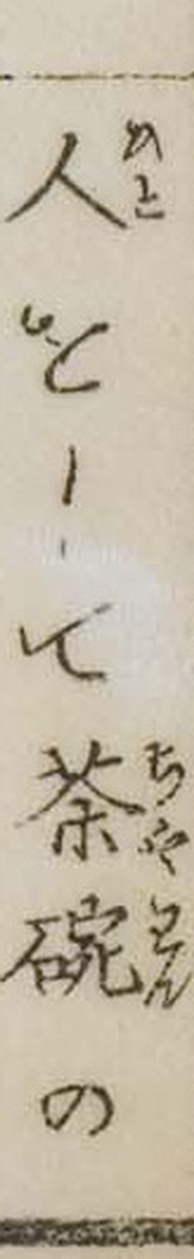人をして茶碗の
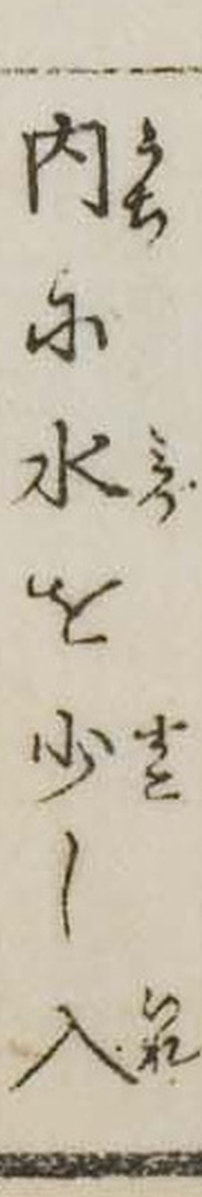内に水を少し入
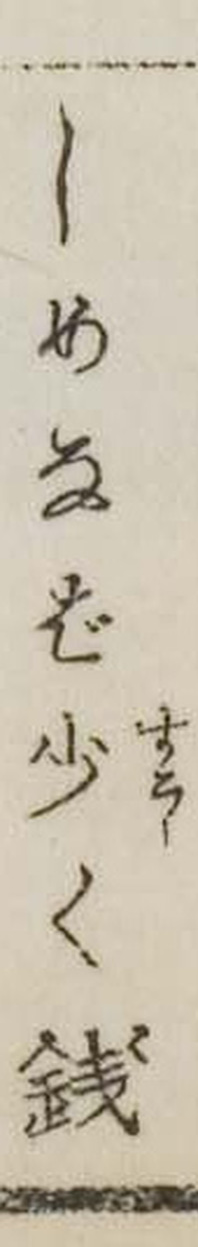しめなば少く銭
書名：究理知慧の勧 : 訓蒙画入 巻之2
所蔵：東京学芸大学附属図書館
